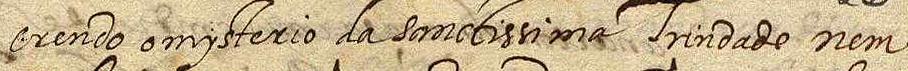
crendo o mysterio da sanctissima Trindade nem
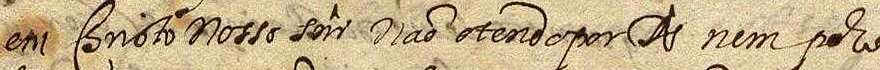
em Christo nosso sn̄r naõ o tendo por Ds̄ nem pelo
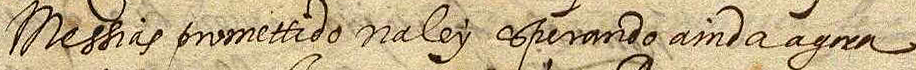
Messias promettido na ley esperando ainda agora
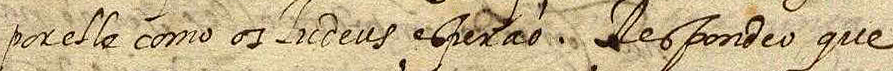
por elle como os Judeus esperaõ. Respondeo que
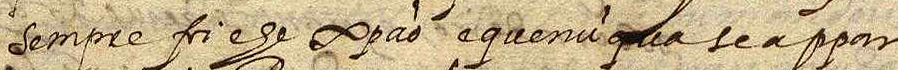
sempre foi e he xpaõ e que nūqua se appar
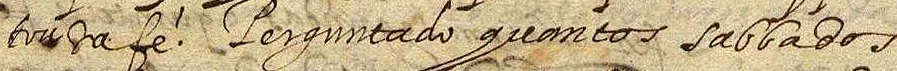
tou da fé. Perguntado quantos sabbados
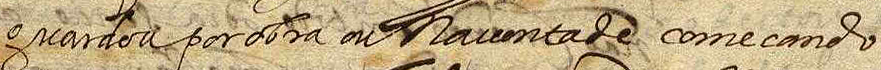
guardou por obra ou na vontade comecando
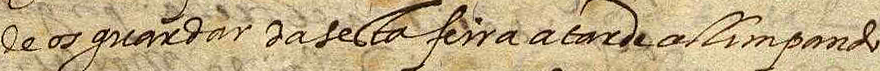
de os guardar da sesta feita a tarde allimpando
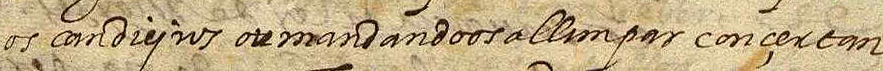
os candiejros ou mandandoos allimpar conçertan
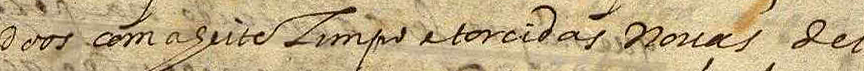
doos com azeite limpo a torcidas novas dei
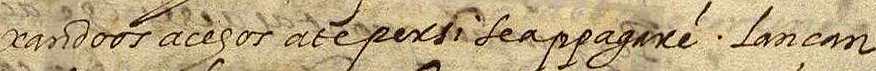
xandoos acezos ate per si se appagarē lançan
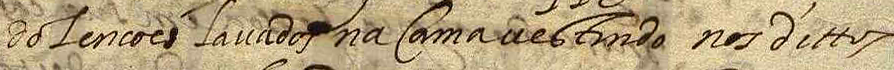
do lencoes lavados na Cama vestindo nos dittos
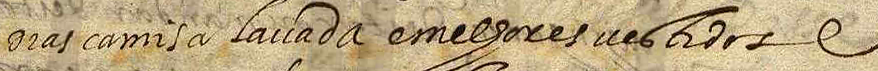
dias camisa lavada e melhores vestidos e
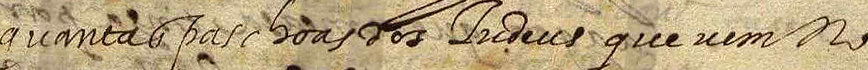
quantas paschoas dos Judeus que vem no
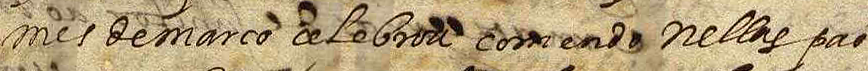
mes de marco çelebrou comendo nellas paõ
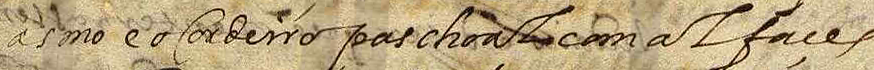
asmo e o cordeiro paschoal com alfaçes
